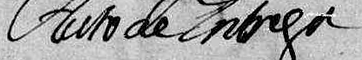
Auto de Entrega
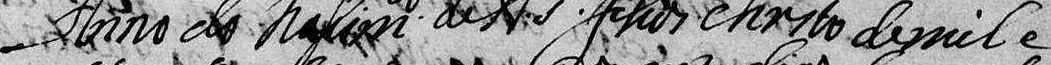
Anno do nascimto. de N. s.or Jesus christo de mil e
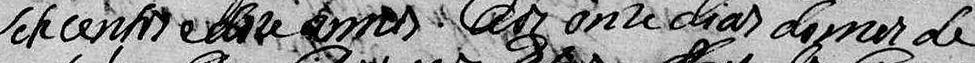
setecentos e doze annos. aos onze dias do mez de
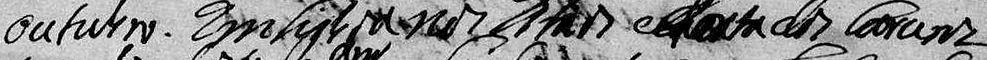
outubro. Em lisboa nos Estaos e _ta dos Carceres
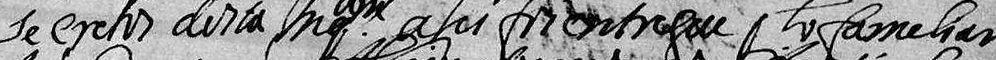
secretos desta Inqam. ahi foi entregue p.lo fameliar
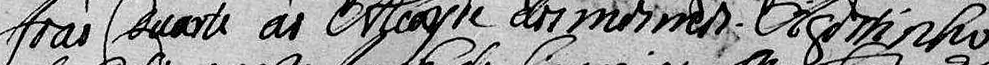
Joaõ Duarte ao Alcayde dos mesmos. Agostinho
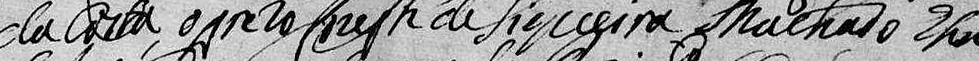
da costa, o prezo Jozeph de siqueira Machado E hu
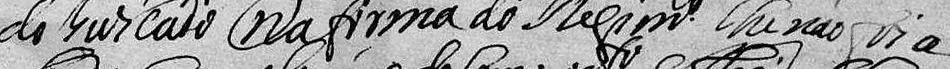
do buscado na forma do Regim.to lhe naõ foi a
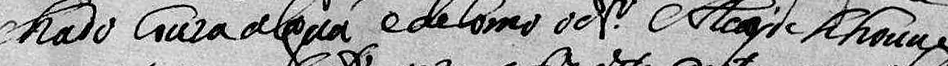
chado couza alguā e de como o d.to Alcayde se houue
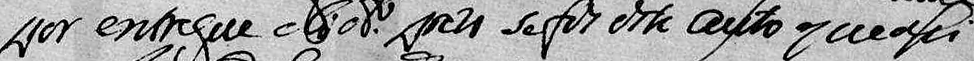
por entregue do d̄.o prezo se fes este auto que assi
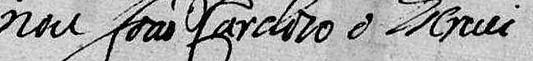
nou Joaõ Cardozo o Escreui
